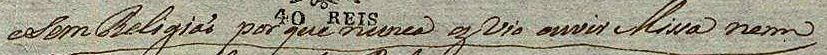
e sem Religiaõ por que nunca oz vio ouvir Missa nem
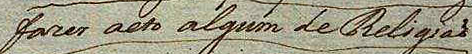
fazer acto algum de Religiaõ.
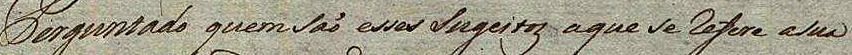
Perguntado quem saõ esses sugeitoz a que se refere a sua
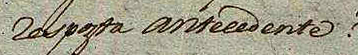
respozta antecedente?
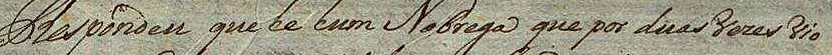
Respondeu que he hum Nobrega que por duas vezes vio
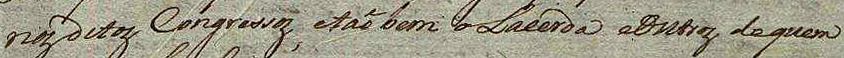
noz ditoz Congressoz, e taõ bem o Lacerda e outroz de quem
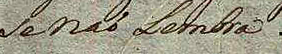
se naõ lembra.
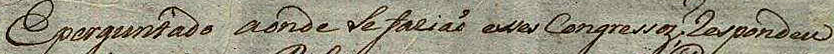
E perguntado aonde se faziaõ esses Congressoz? Respondeu
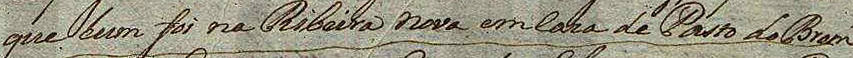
que hum foi na Ribeira Nova em caza de Pasto do Bran,
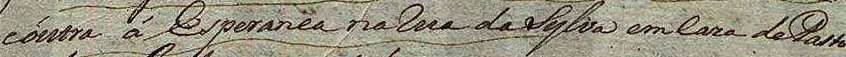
e óutra á Esperanca na Rua da Sylva em Caza de Pasto
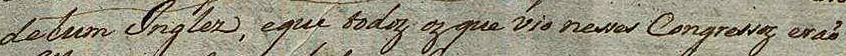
de hum Inglez, e que todoz oz que vio nesses Congressoz eraõ
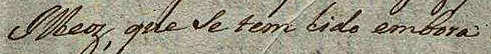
Ilheoz, que se tem hido embora.
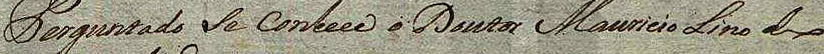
Perguntado se conhece o Doutor Mauricio Lino do
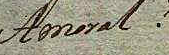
Amaral?
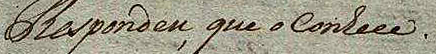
Respondeu, que o conhece.
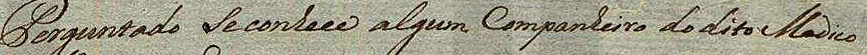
Perguntado se conhece algum Companheiro do dito Medico
